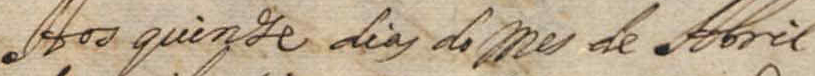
Aos quinze dias do mes de Abril
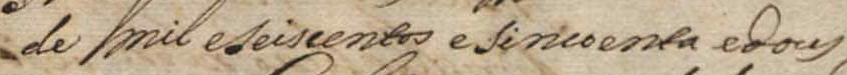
de mil e seiscentos e sincoenta e dous
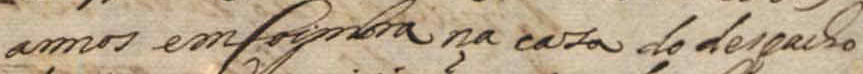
annos em Coimbra na caza do despacho
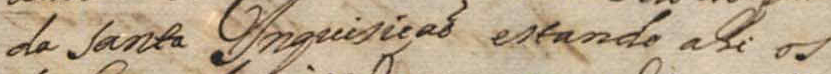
da santa Inquisiçaõ estando ahi os
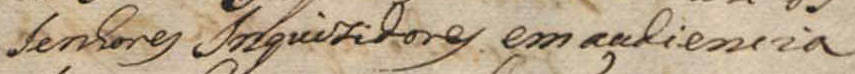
senhores Inquizidores em audiencia
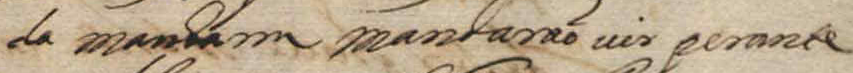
da manham mandaraõ uir perante
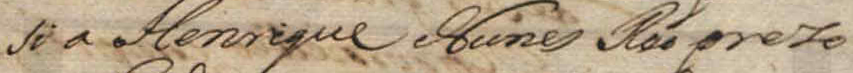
si a Henrique Nunes Reo prezo
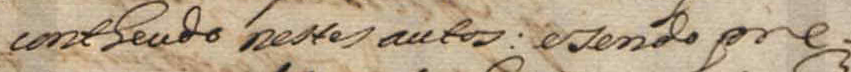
contheudo nestes autos: e sendo pre
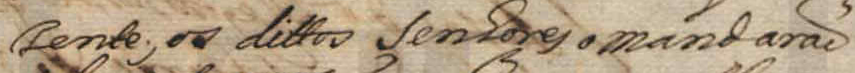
zente, os dittos senhores o mandarão
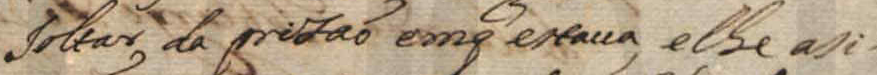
soltar da prizaõ em q̄ estaua, e lhe asi
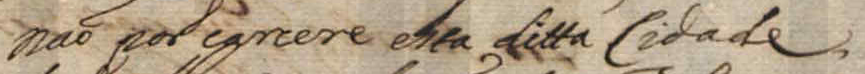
naõ por carcere esta ditta Cidade
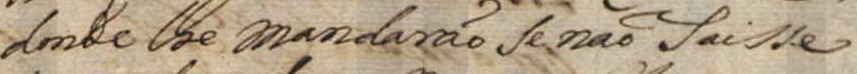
donde lhe mandarão se naõ saisse
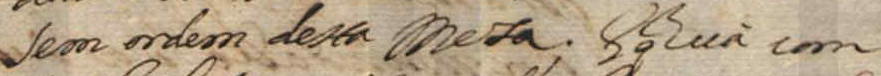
sem ordem desta meza. E q̄ uá com
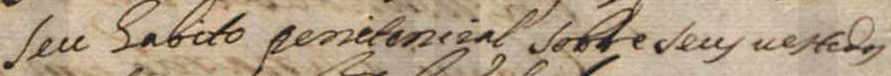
seu habito penitencial sobre seus uestidos
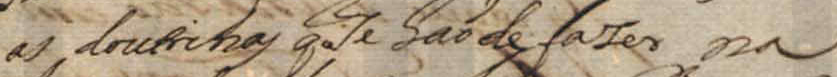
as doutrinas q̄ se haõ de fazer na
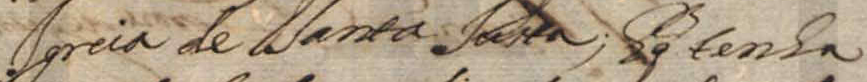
Igreia de Santa Iusta; E q̄ tenha
